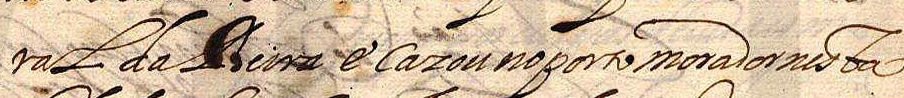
ral da Beira, e cazou no porto morador nesta
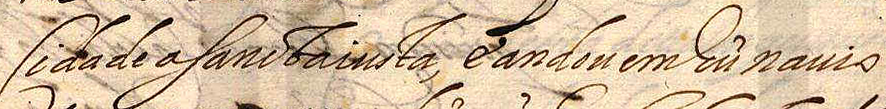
Cidade a sancta iusta, e andou em hū nauio
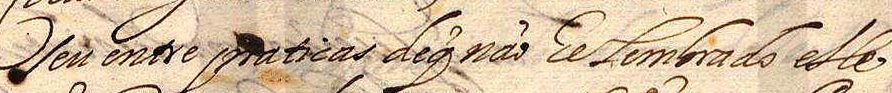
seu entre praticas de q̄ não he lembrado elle
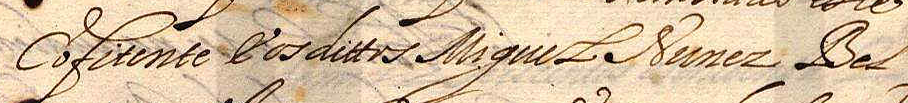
cōfitente, e os dittos Miguel Nunez Bel
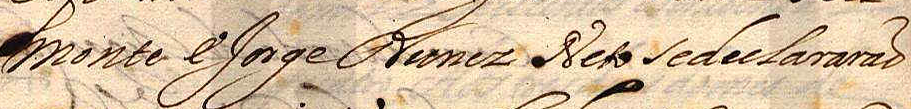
monte e Jorge Nunez Neto se declararaõ
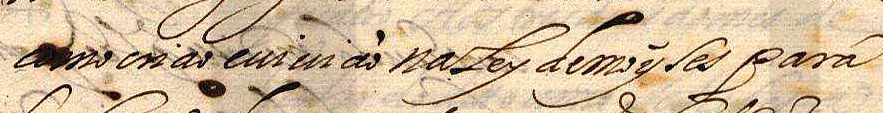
como criaõ e uiuiaõ na Ley de moyses para
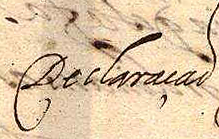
Declaraçaõ
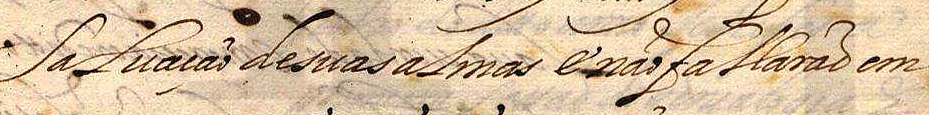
Saluaçaõ de suas almas, e não fallarão em
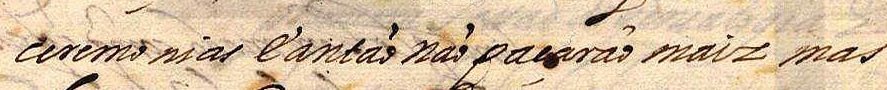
ceremonias e antaõ naõ paçarão maiz, mas
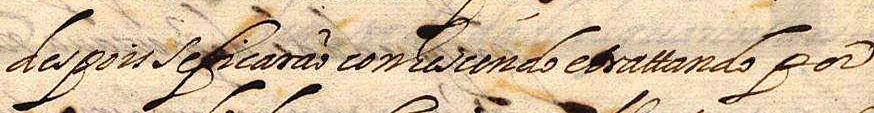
despois se ficarão conhescendo e trattando por
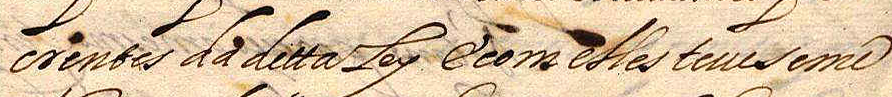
crentes da ditta Ley e com elles teue seme
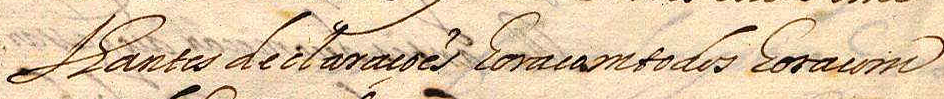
tantes declaraçoẽs hora com todos hora com
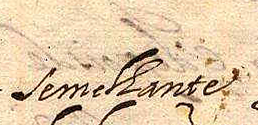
semelhante
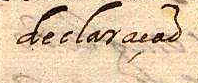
declaraçaõ
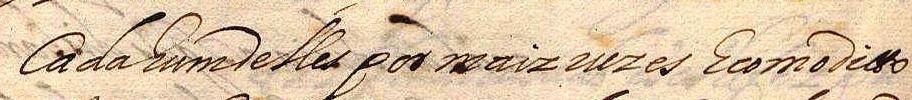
Cada hum delles por mais uezes E com o ditto
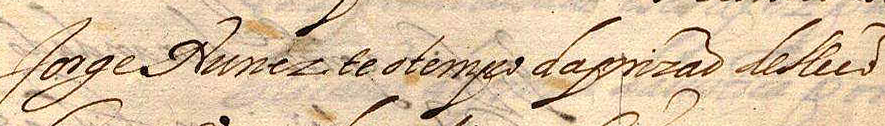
Jorge Nunez te o tempo da prizaõ delle cō
